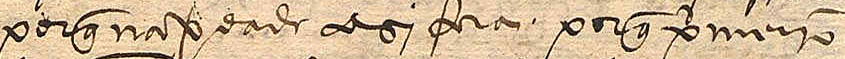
porq̅ na ꝟdade asj fora porq̅ p̄meiro
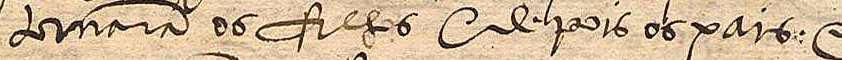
tomara̅ os filhos e depois os pais. e
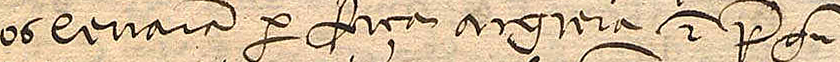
os leuara̅ ꝑ força a egreia item p̄gu̅
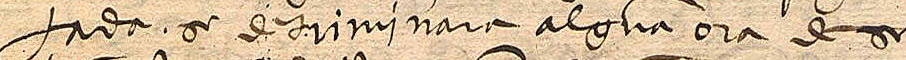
tada se detrimjnara algu̅a ora de se
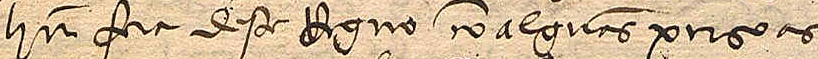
hir fora deste Regno co̅ algu̅as pessoas
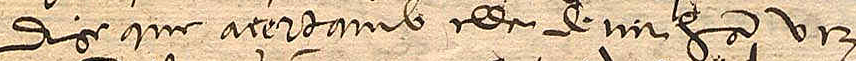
dise que açertando ella de uir hu̅a vez
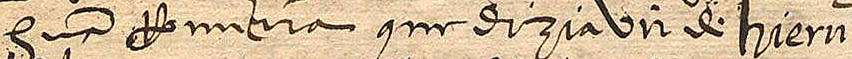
hu̅a Romeira que dizia vir de hieru
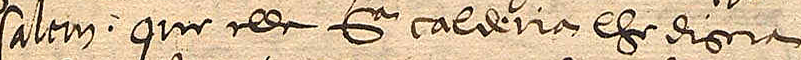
salem. que ella m̄a caldeira lhe disera
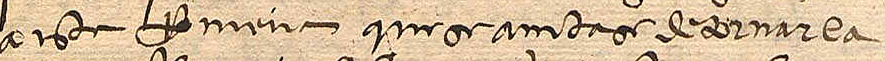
a esta Romeira que se aceitase de tornar la
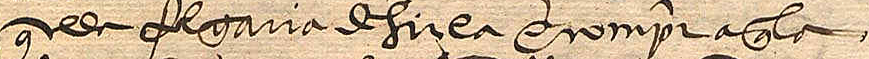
q̅ ella folgaria de hir e a comp̅r aq̅la
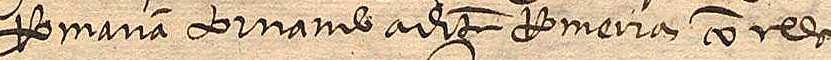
Romaria tornando a dit̅a Romeira c̅o ella
